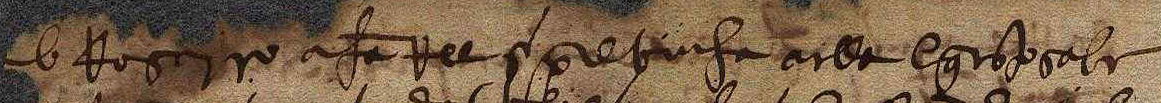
do Rosajro a ħa Ree sēpre vinha a ella e q̅ esto sabe
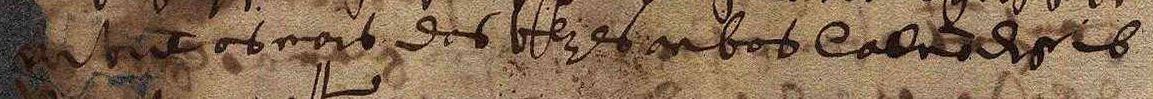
ouvirē as mais das vezes ambas e al nā dise do
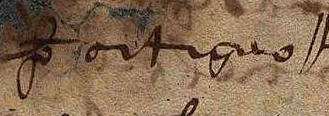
ħo artiguo //
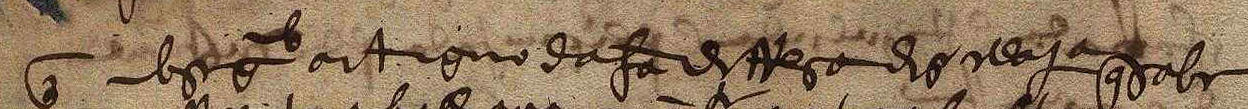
item do segdo artiguo da ħa deffesa dis ella ta q̄ sabe
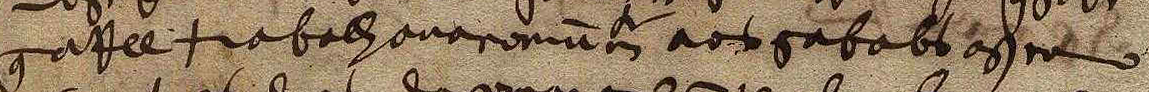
q̄ a Ree trabalhaua comūmte aos sabados asj como
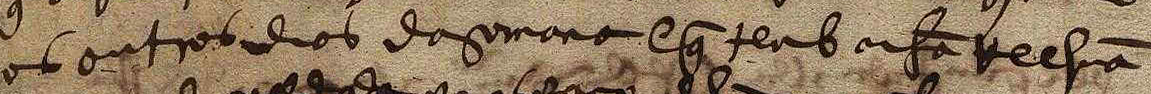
os outros dias da somana e q̄ tendo a ħa Ree huā
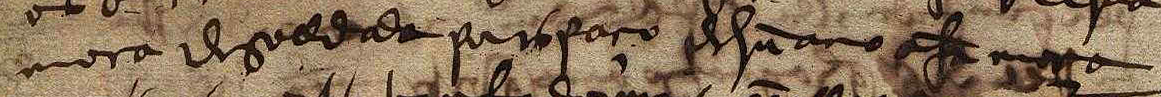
moça de solldada por espaço de hū ano a ħa moça
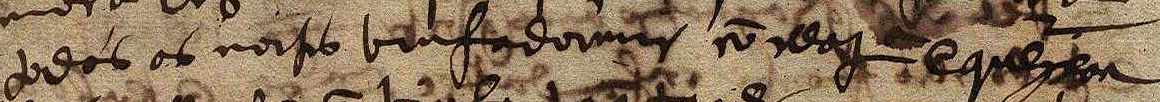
todos as noites vinha dormir c̄o ella ta e quejxan
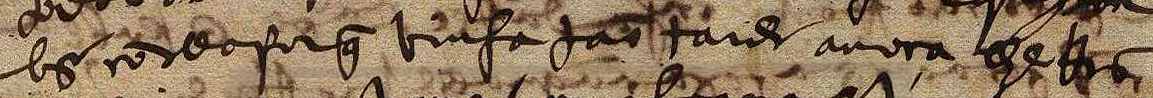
dose cō ella porq̄ vinha tao tarde a moça lhe Res
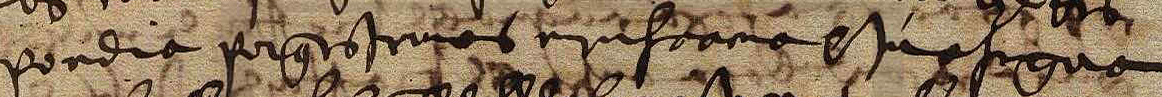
pondia porq̄ estemos mjnha ama e tua te gora
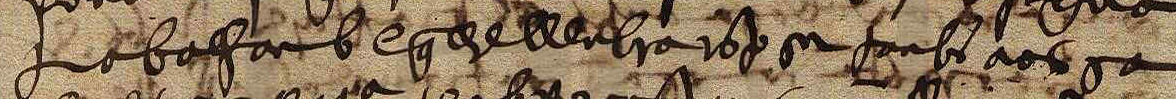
trabalhando e q̄ lhe llenbra isto ser tambē aos sa
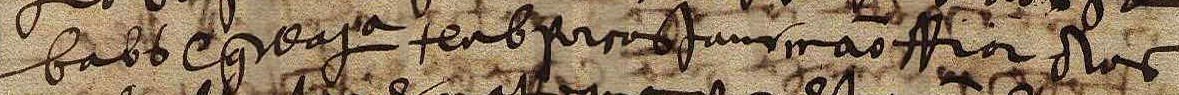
bados e q̅ ella ta tendo por costume não ffiar Aos
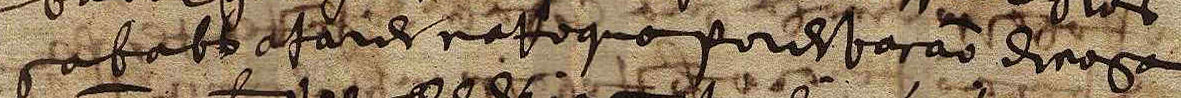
sabados a tarde na Roqua por devoção de nosa
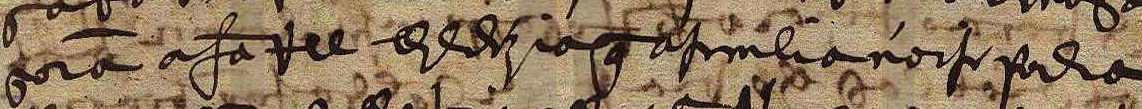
sorā a ħa Ree lhe dizia q̄ a tinha noite podia
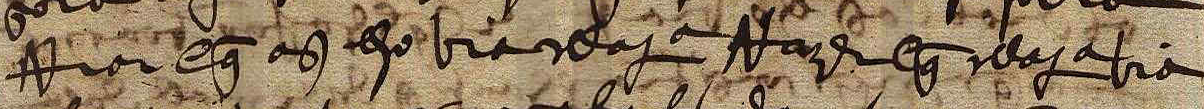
ffiar e q̄ asj lho via ella ta ffazer e q̄ ella ta via
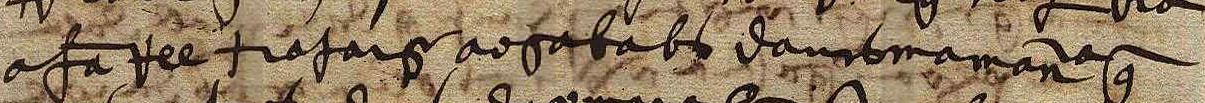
a ħa Ree trajarse ao sabados da mesma manra q̄
